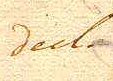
decl.
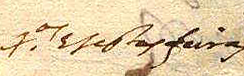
4.as E sestas feiras
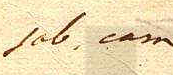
sab. cam.
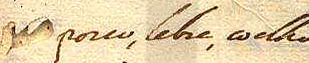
porco, lebre, coelho
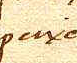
peixe
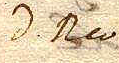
d. Reo
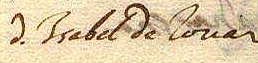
d. Isabel de Touar
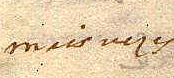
mais uezes
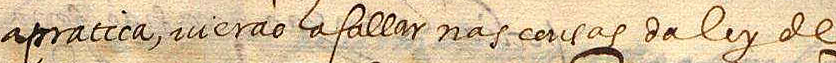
a pratica, uieraõ a fallar nas cousas da ley de
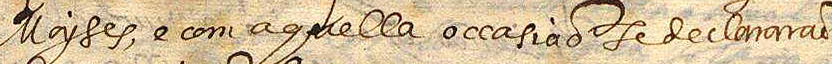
Moyses, e com aquella occasiaõ se declararaõ
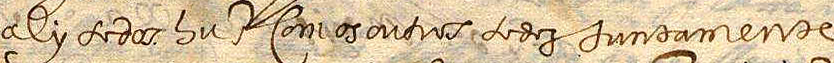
aly todos hūs Com os outros todos Iuntamente
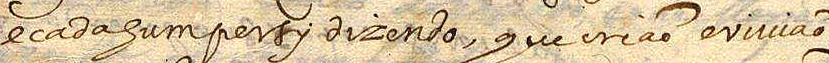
e cada hum per sy dizendo, que criaõ e viuiaõ
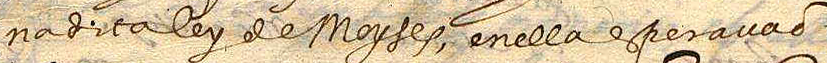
na dita ley de moyses e nella esperauaõ
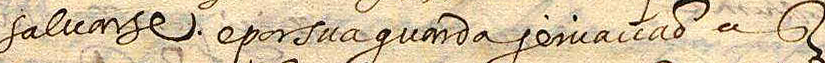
saluarse e por sua guarda jeiuauaõ as
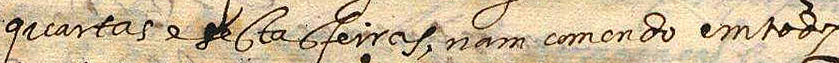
quartas e sestas feiras, nam comendo em todos
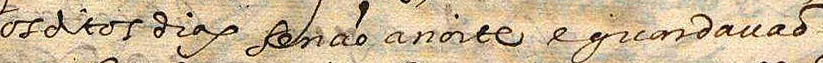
os ditos dias senaõ a noite e guardauaõ
